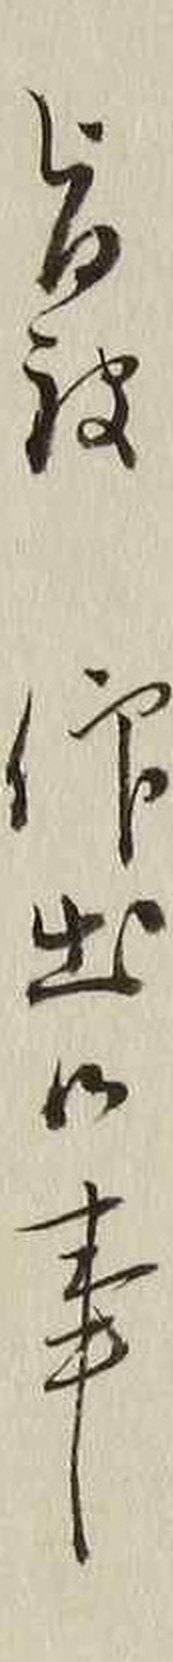旨被仰出候事
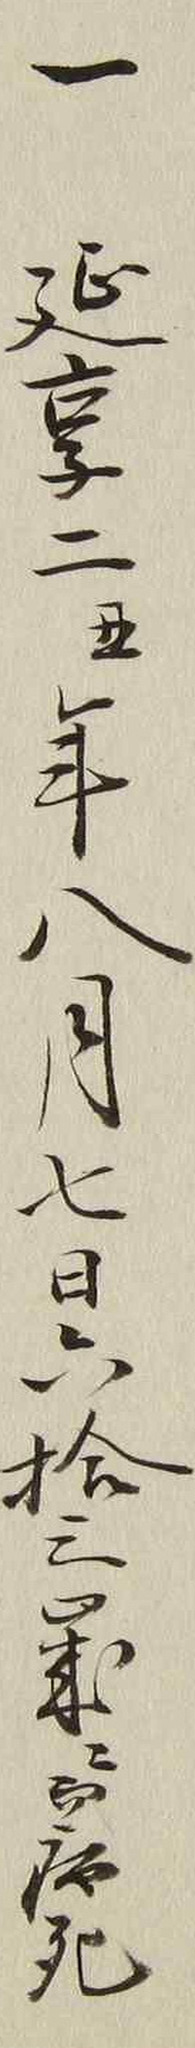一延享二丑年八月七日六拾三歳ニ而病死
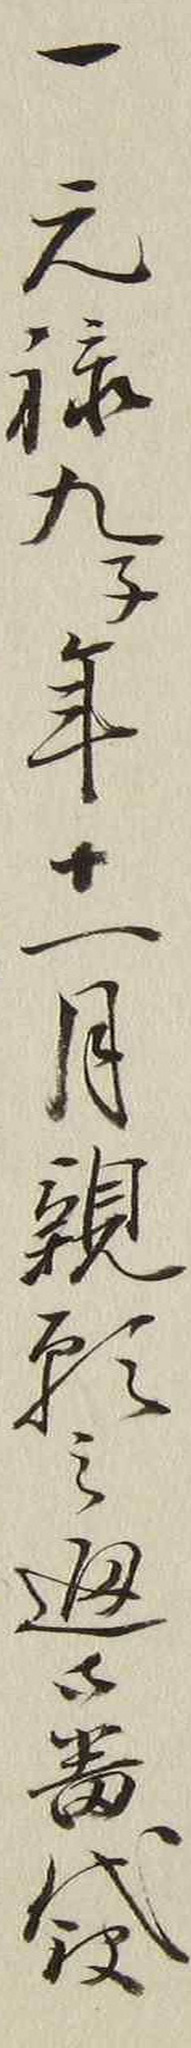一元禄九子年十一月親願之通御番代被
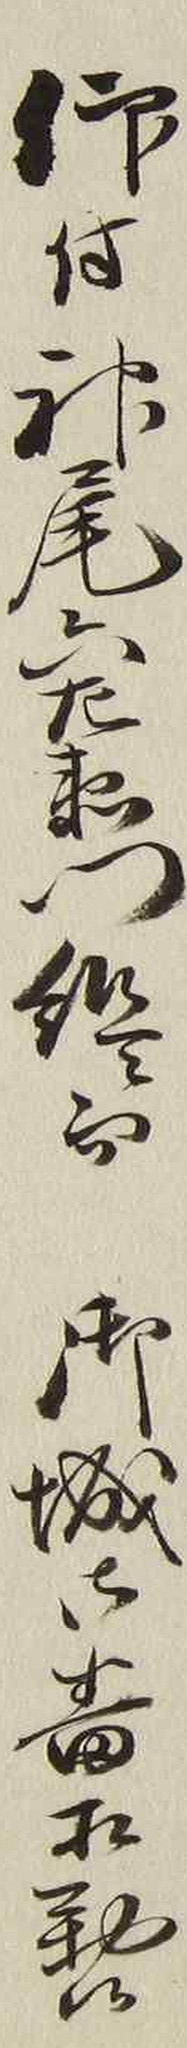仰付神尾六左衛門組ニ而御城御番相勤候
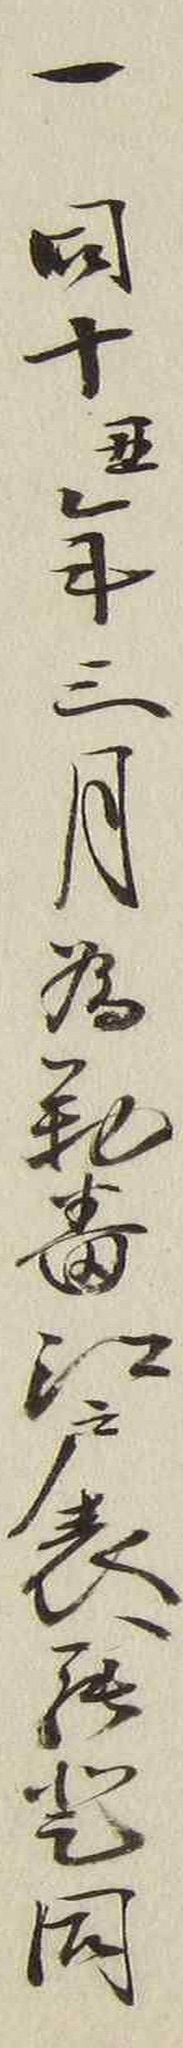一同十丑年三月為勤番江戸表ㇸ罷登同

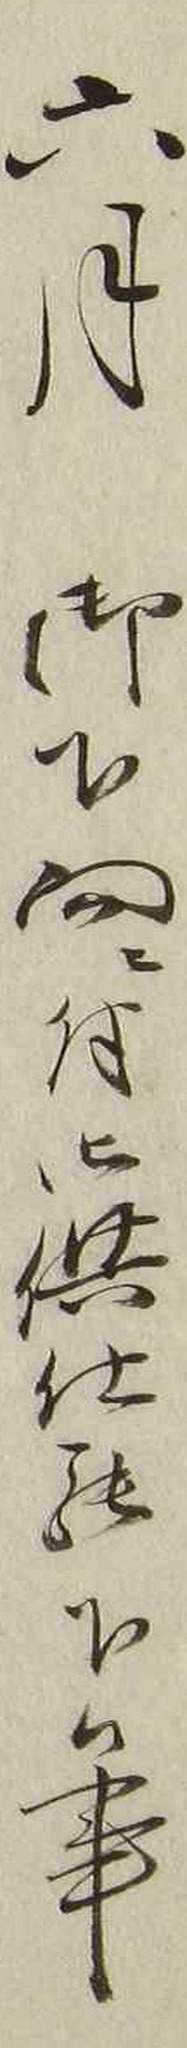六月御下向ニ付御供仕罷下候事
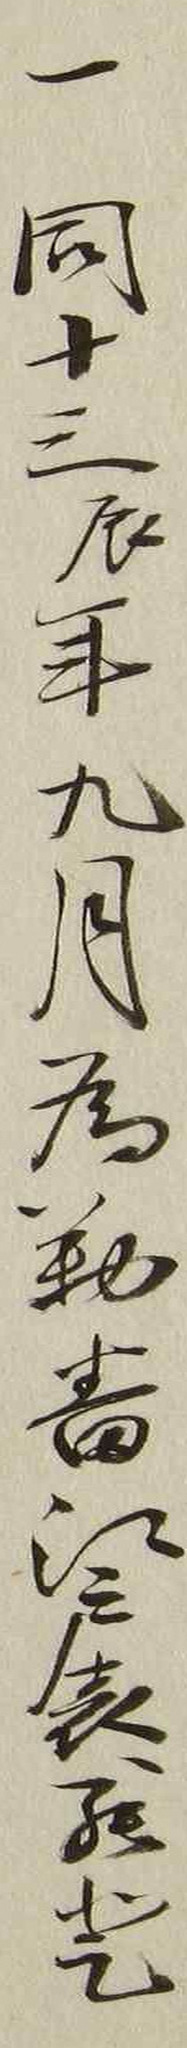一同十三辰年九月為勤番江戸表ㇸ罷登
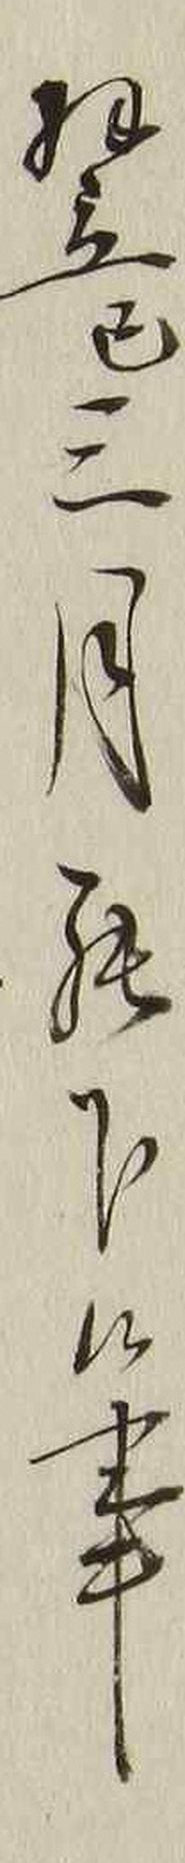翌巳三月罷下候事
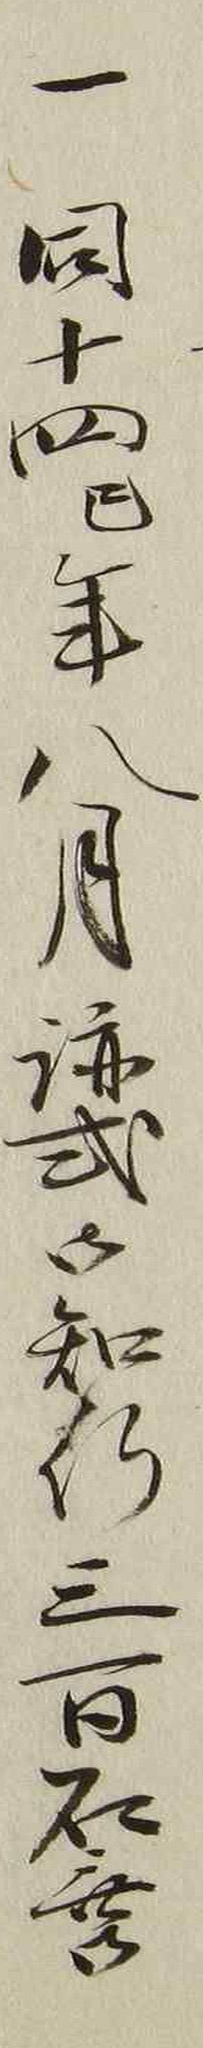一同十四巳年八月跡式御知行三百石無御
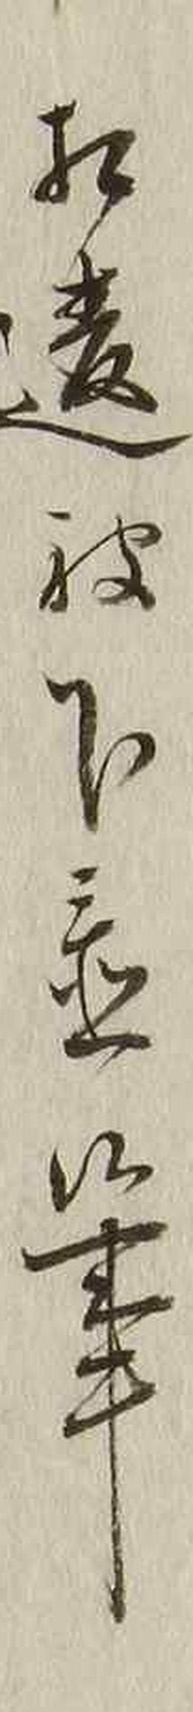相違被下置候事
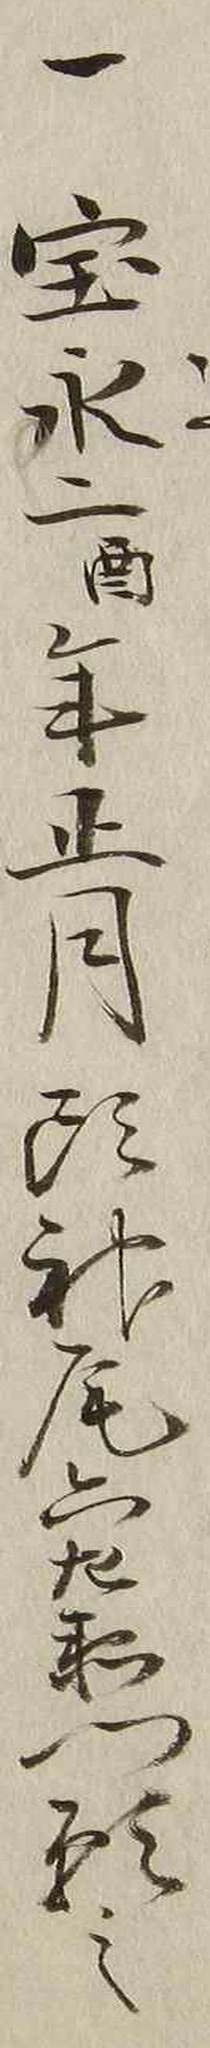一宝永二酉年正月頭神尾六左衛門願之
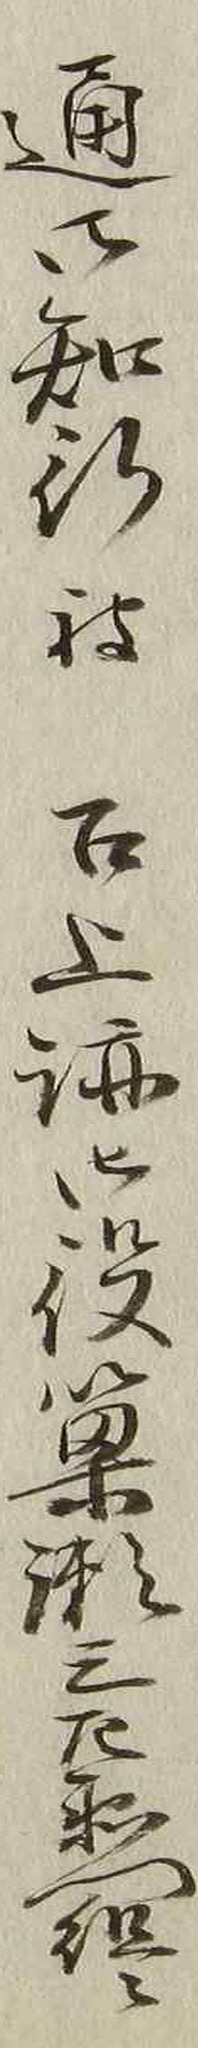通御知行被召上跡御役簗瀬三左衛門組ニ
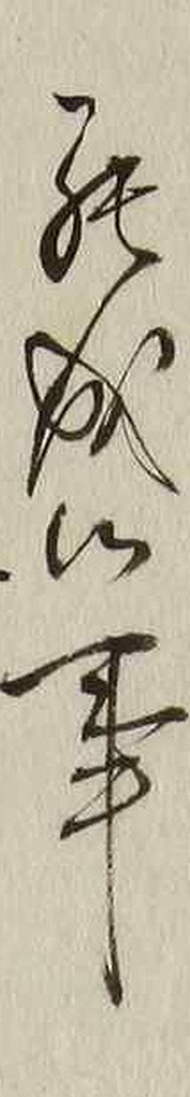罷成候事
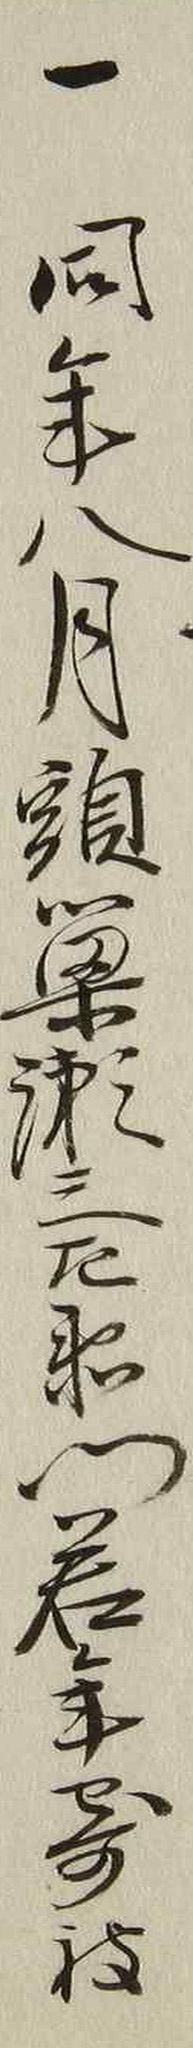一同年八月頭簗瀬三左衛門若年寄被
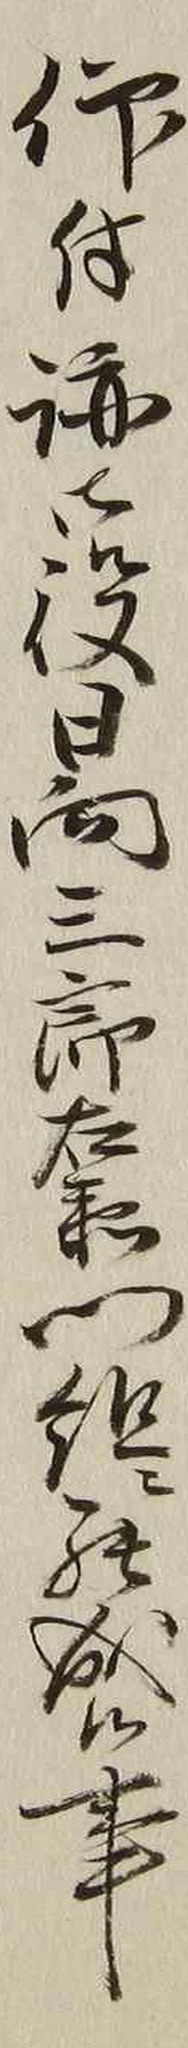仰付跡御役日向三郎右衛門組ニ罷成候事
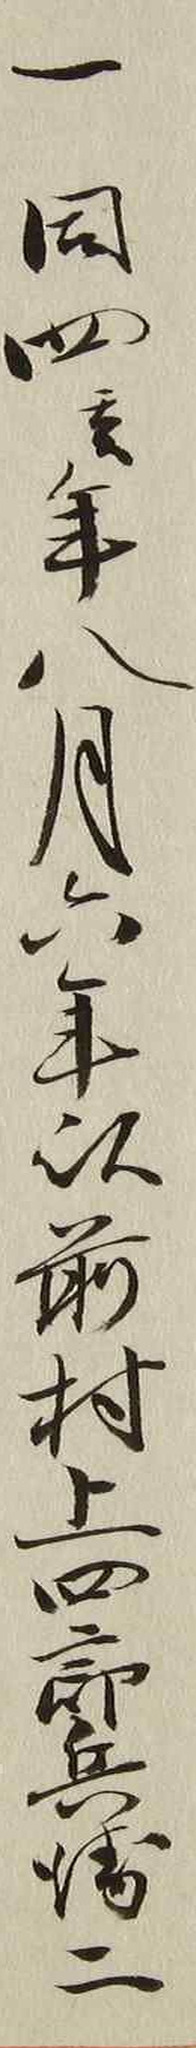一同四亥年八月六年以前村上四郎兵衛二
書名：諸士系譜　巻之163　な之部5
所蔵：会津若松市立会津図書館
